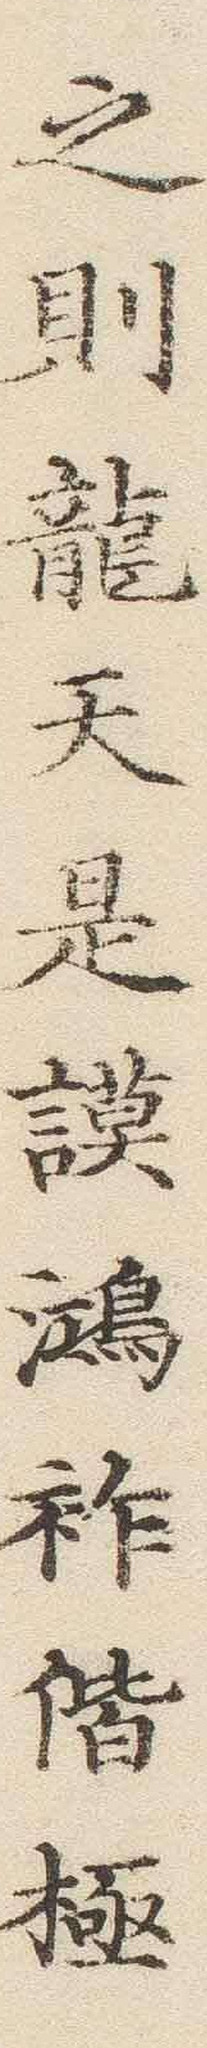之則龍天是謨鴻祚偕極
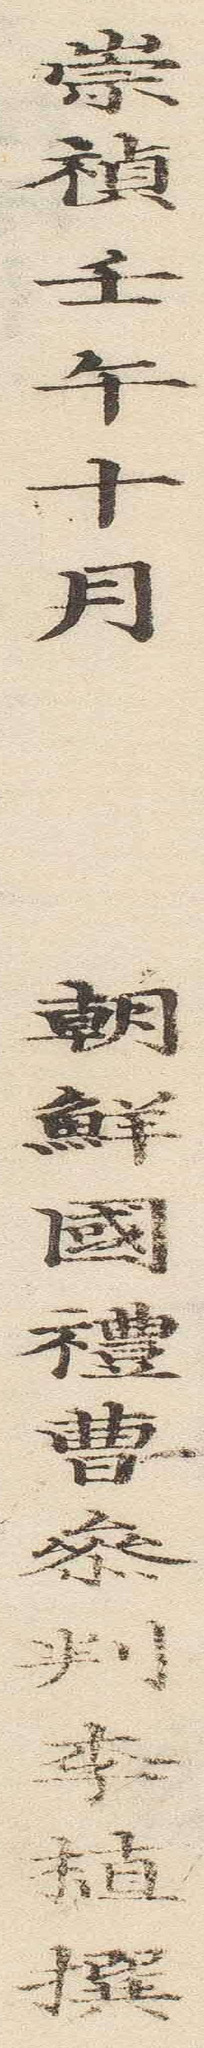崇禎壬午十月朝鮮國禮曹叅判李植撰
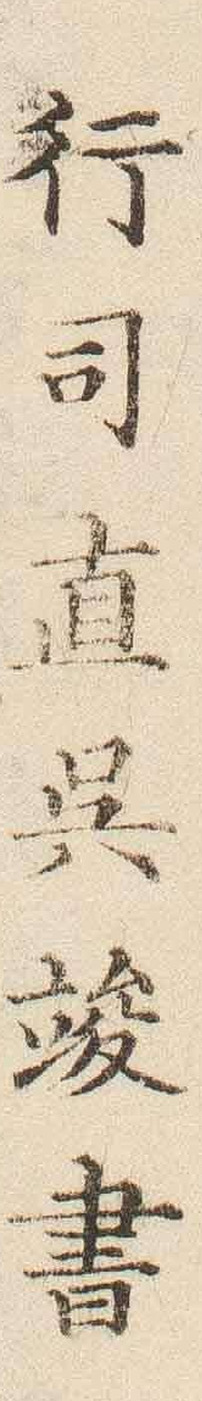行司直呉竣書
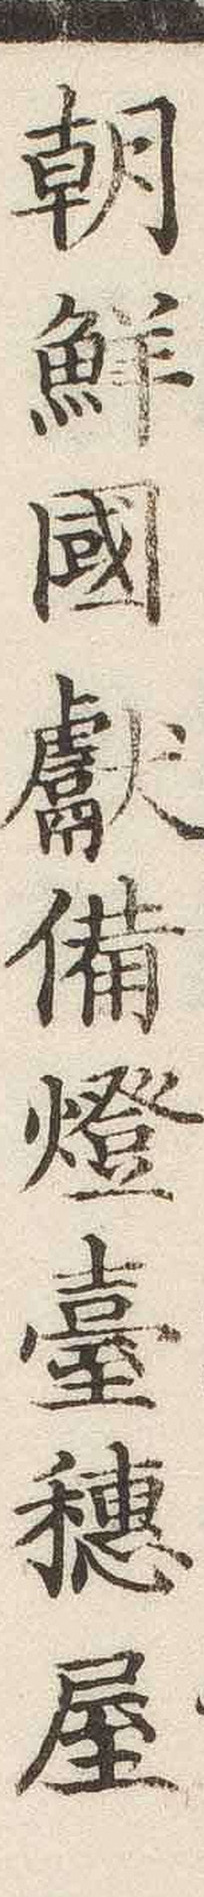朝鮮國獻備燈臺穗屋
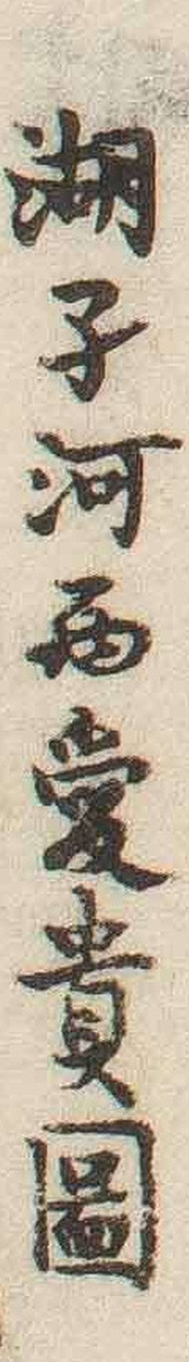湖孑河西愛貴圖

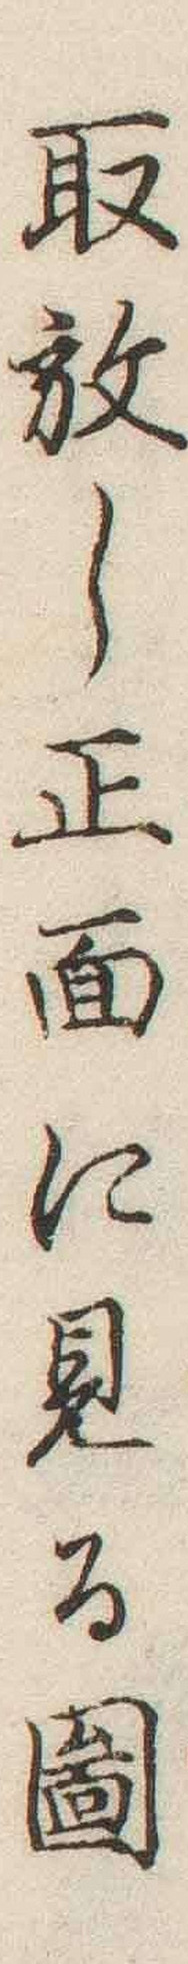取放し正面に見る圖
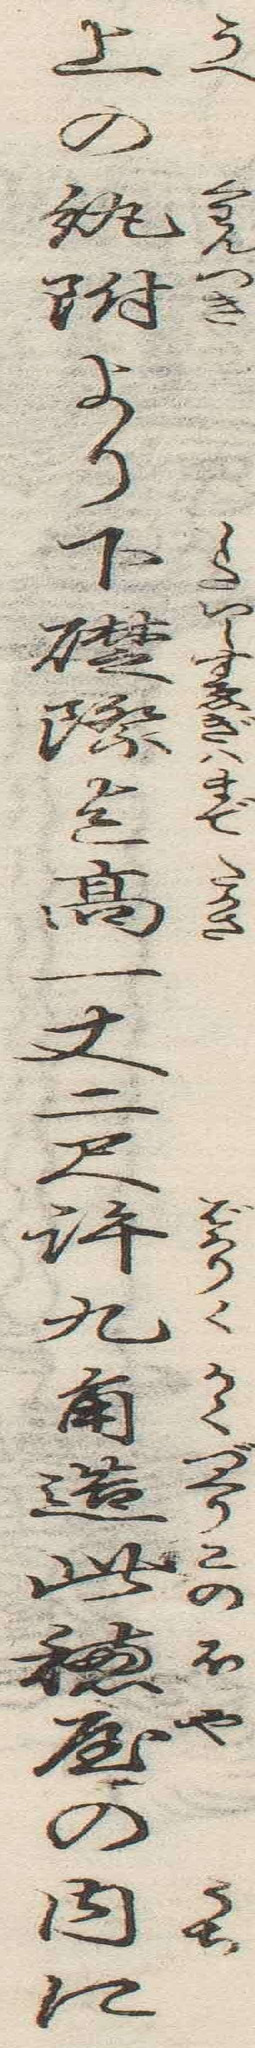上の紈附より下礎際迄髙一丈二尺許九角造此穂屋の内に
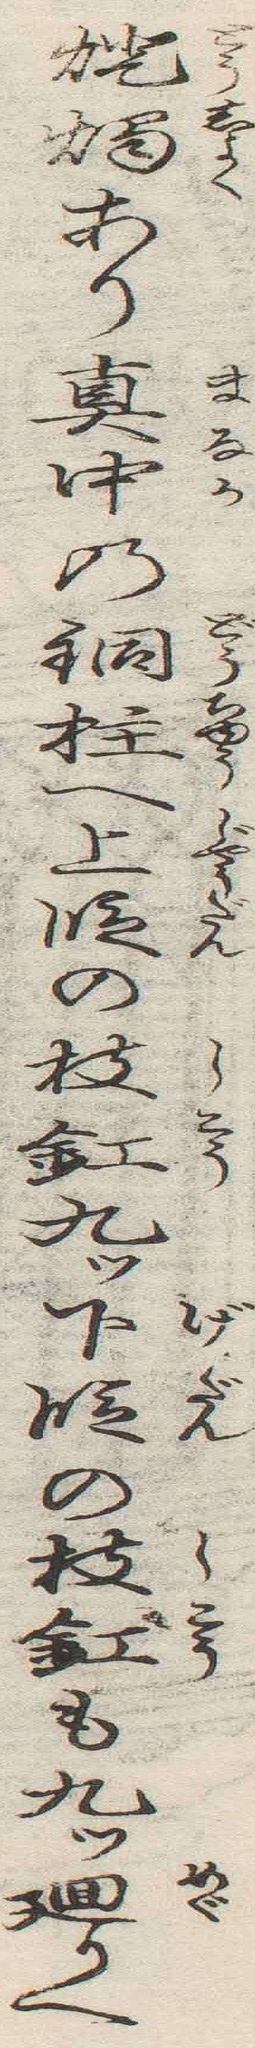燈燭あり真中の銅柱へ上段の枝釭九ッ下段の枝釭も九ッ廽りへ
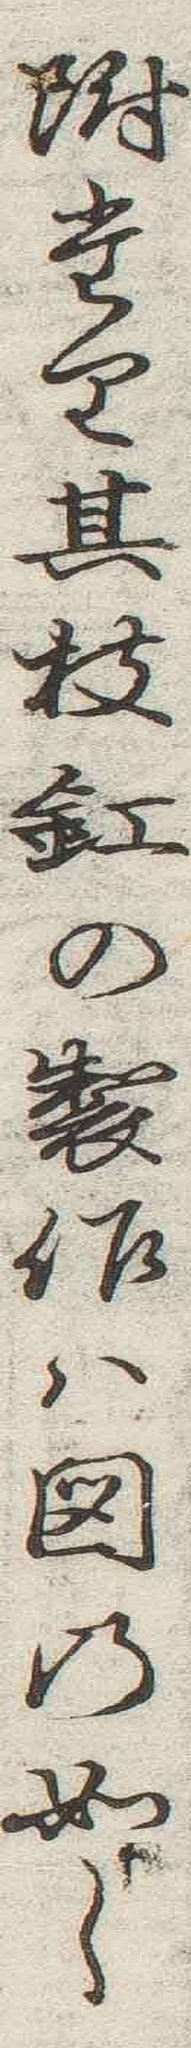附たり其枝釭の製作は図の如し
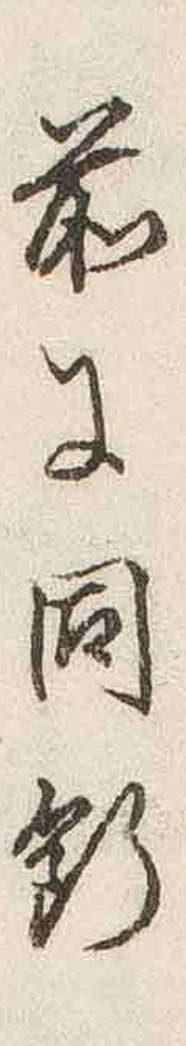前に同断
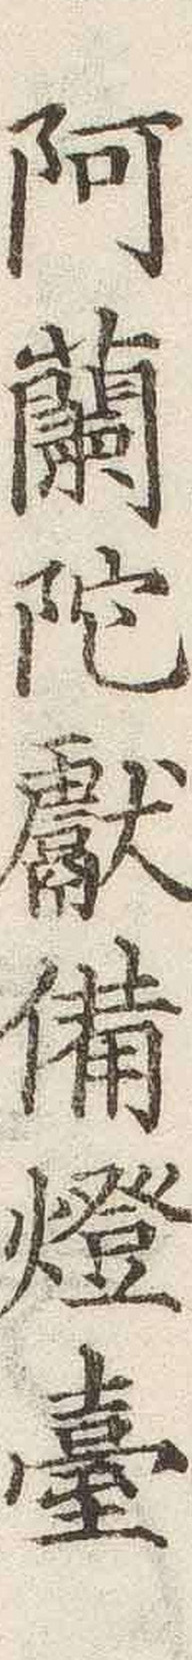阿蘭陀獻備燈臺
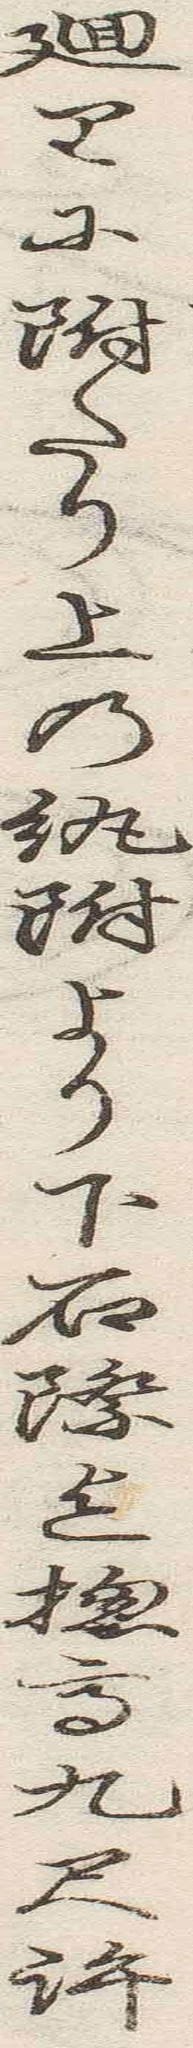廽りに附たり上の紈附より下石際迄揔高九尺許
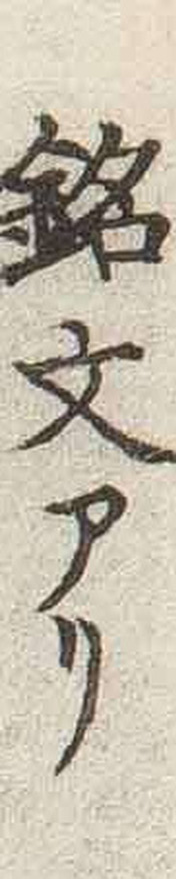銘文アリ
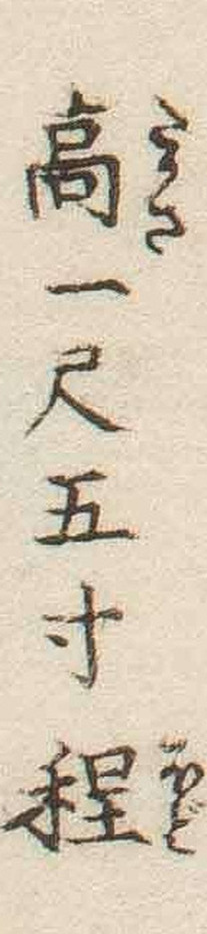高一尺五寸程

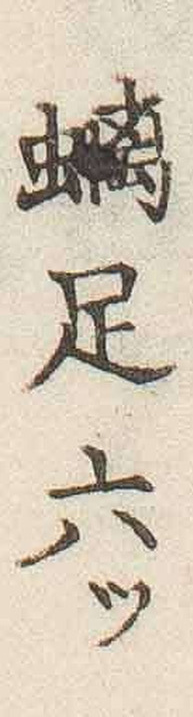螭足六ッ
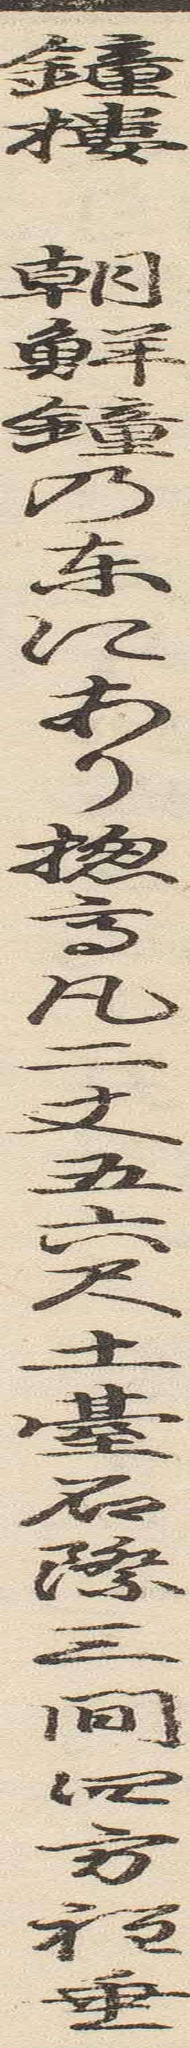鐘樓朝鮮鐘の東にあり揔高凡二丈五六尺土臺石際三間四方程垂
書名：日光山志
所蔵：東京学芸大学附属図書館 国文学研究資料館
